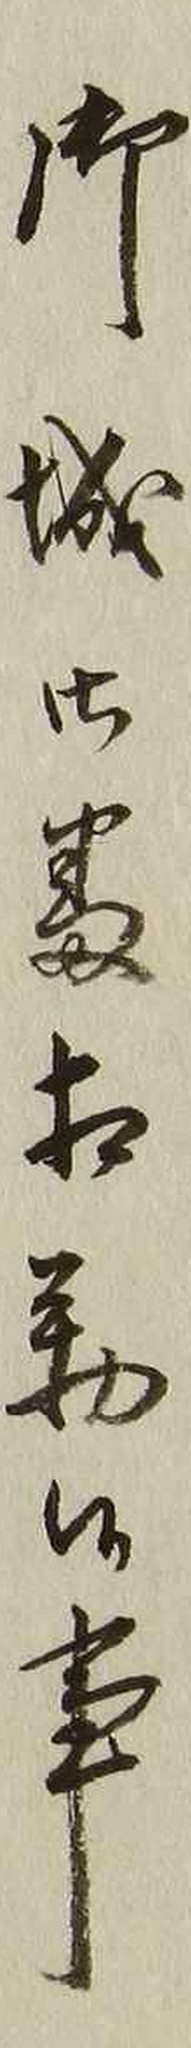御城御番相勤候事
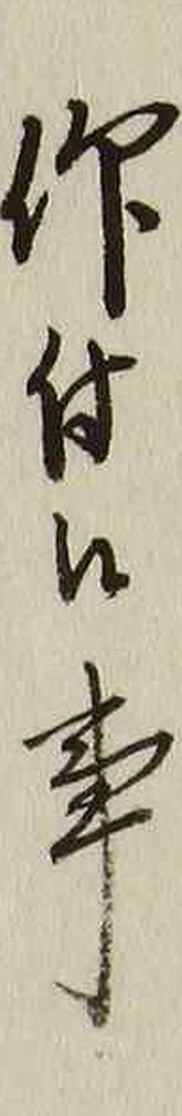仰付候事
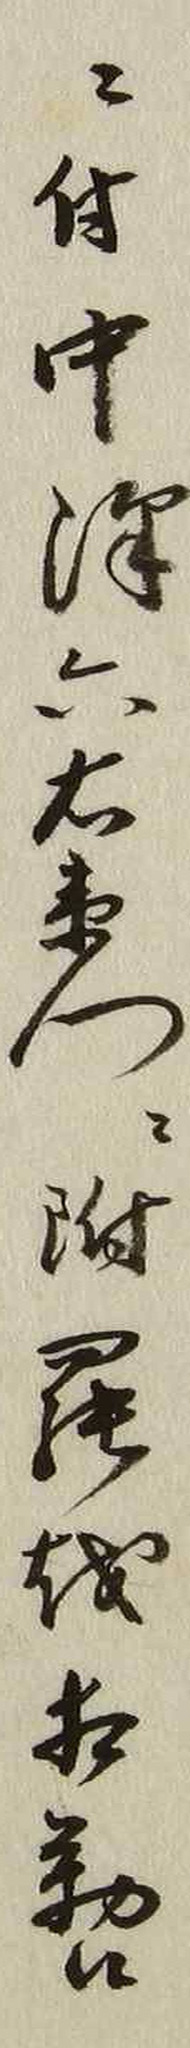ニ付中沢六右衛門ニ附罷越相勤候
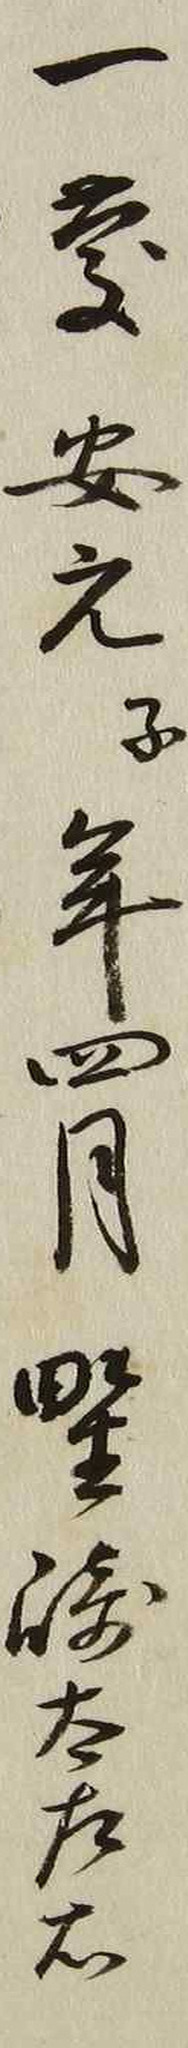一慶安元子年四月野崎太左右
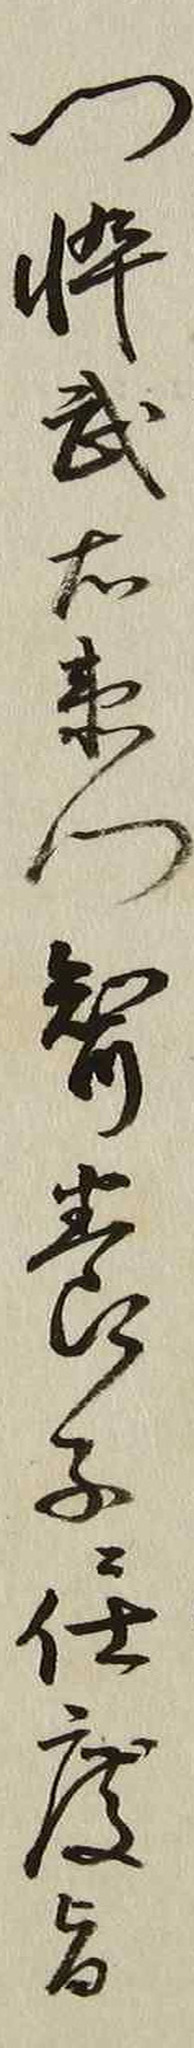門忰武右衛門婿養子ニ仕度旨
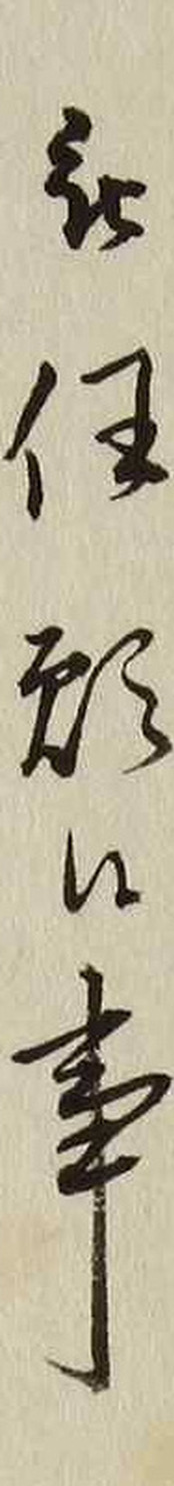被任願候事
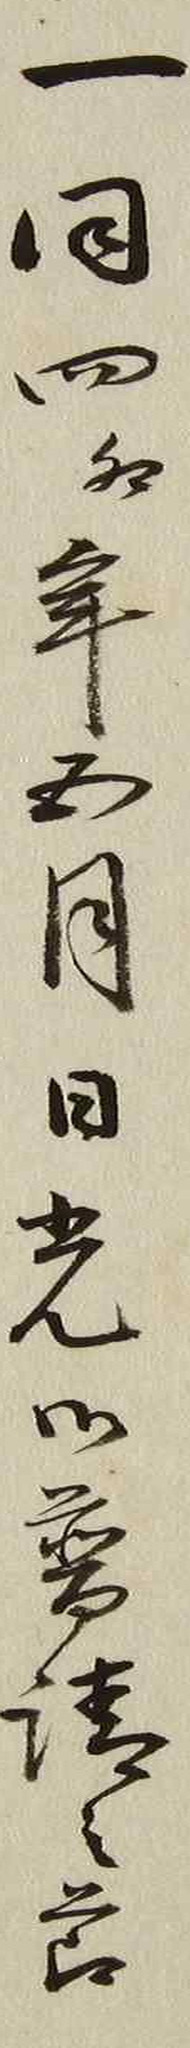一同四卯年五月日光御普請之節
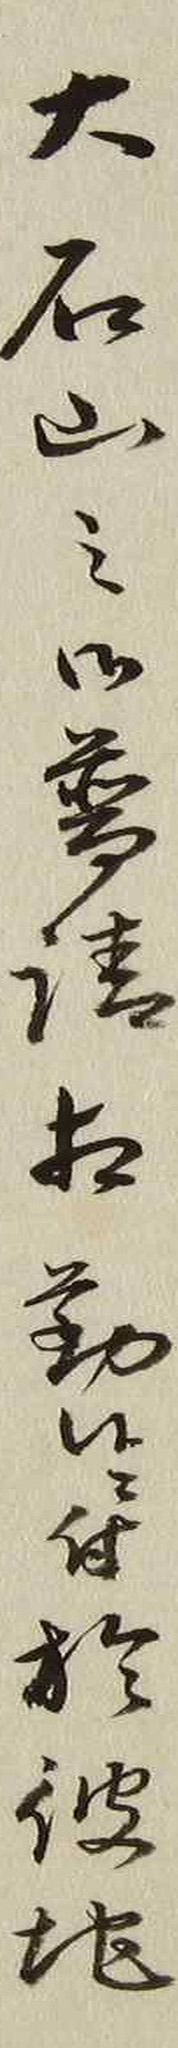大石山之御普請相勤候ニ付於彼地
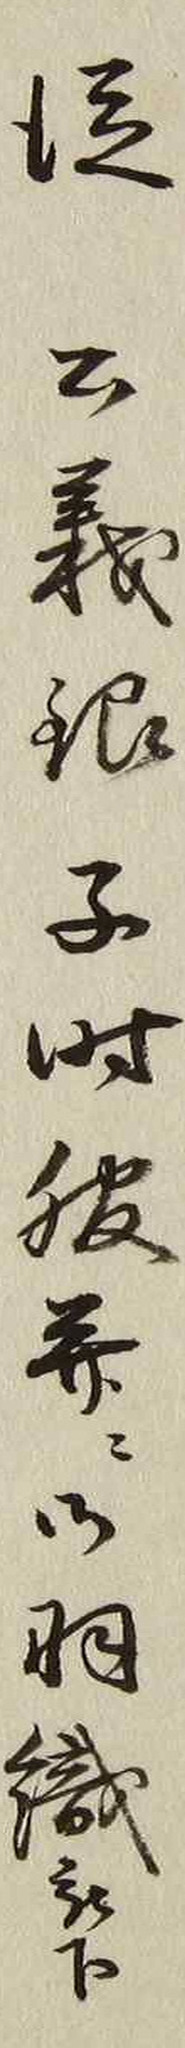従公義銀子時服并ニ御羽織被下
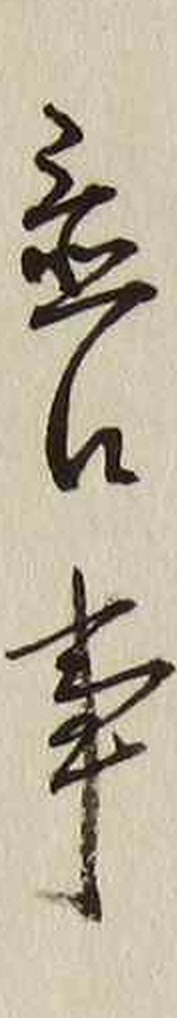置候事
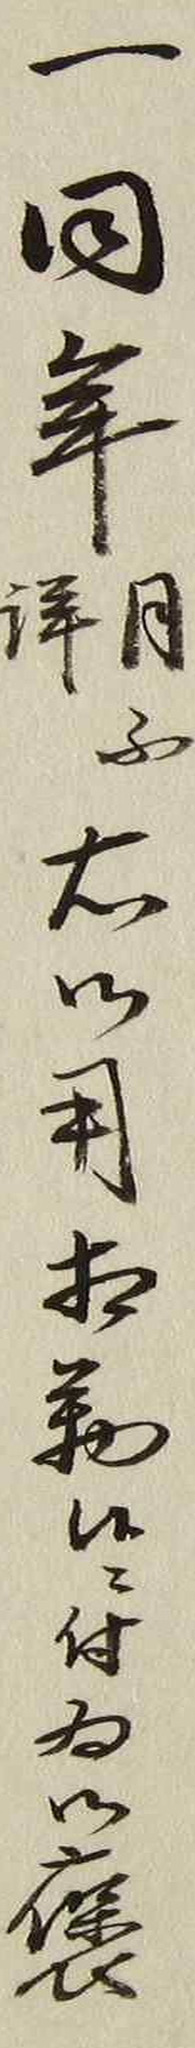一同年月不詳右御用相勤候ニ付為御褒
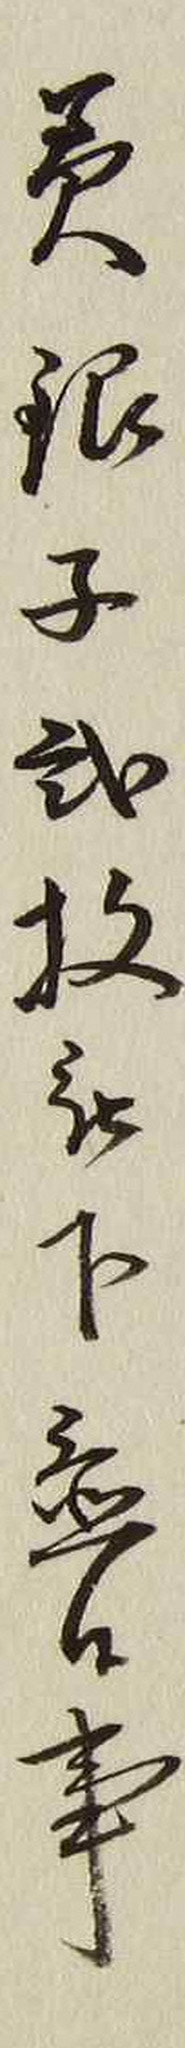美銀子弐枚被下置候事
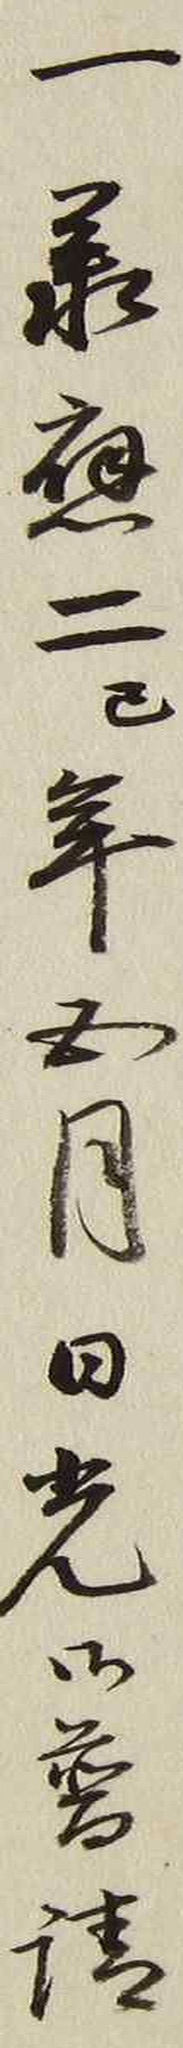一承応二巳年五月日光御普請
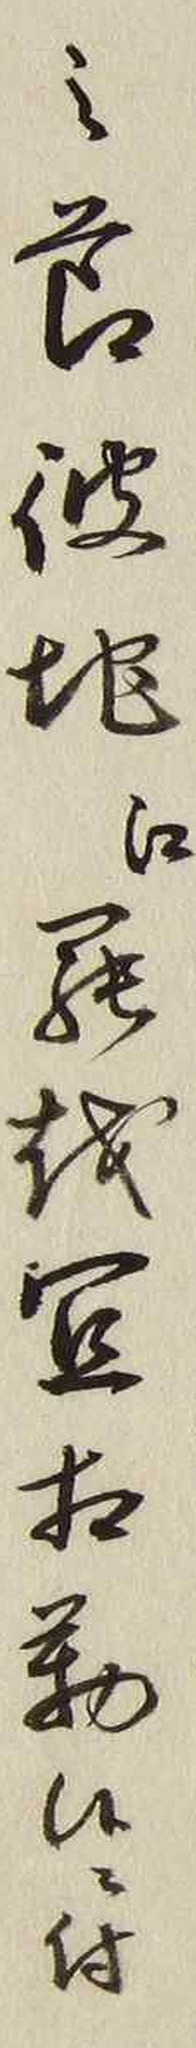之節彼地江罷越宜相勤候ニ付
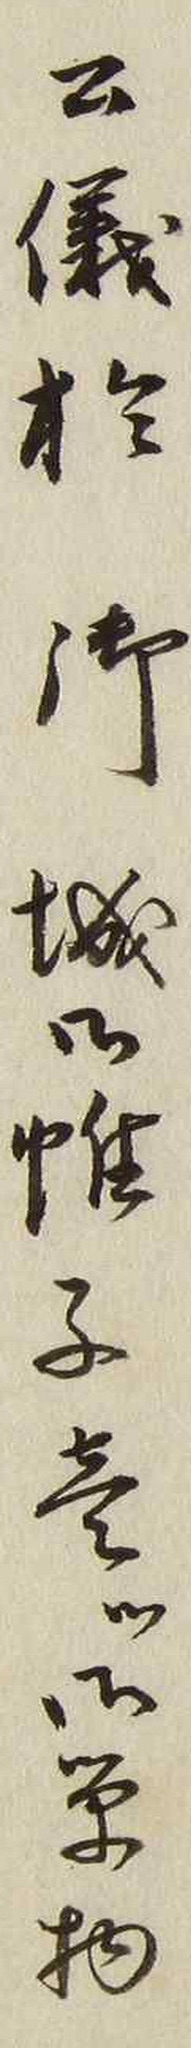公儀於御城御帷子壱ツ御単物

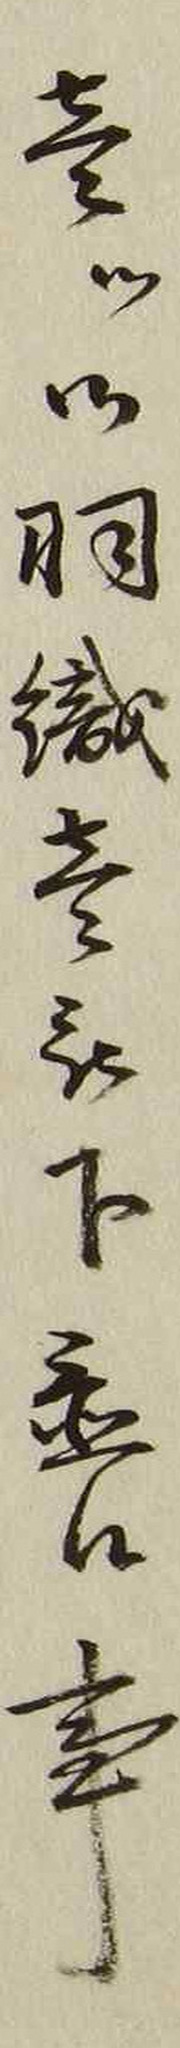壱ツ御羽織壱被下置候事
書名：諸士系譜　巻之149　そ之部2
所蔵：会津若松市立会津図書館
